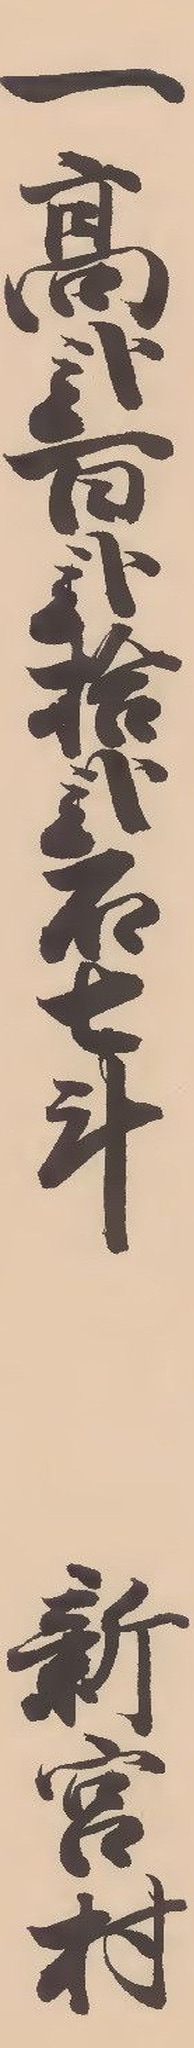一高弐百弐拾弐石七斗新宮村
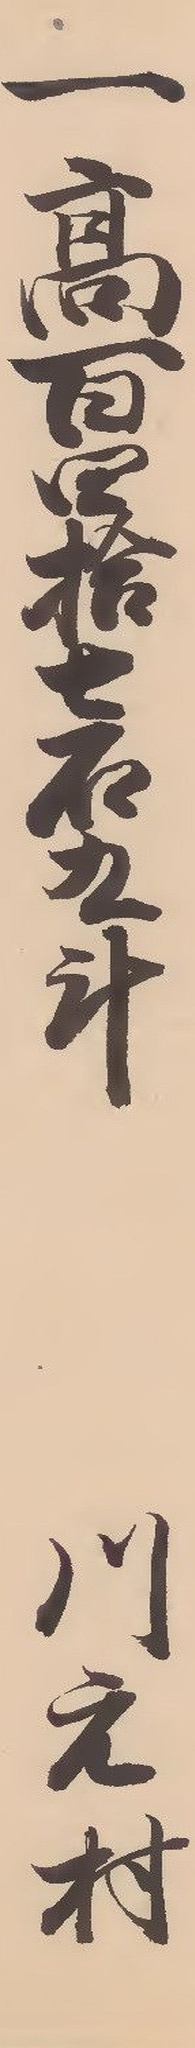一高百四拾七石九斗川元村
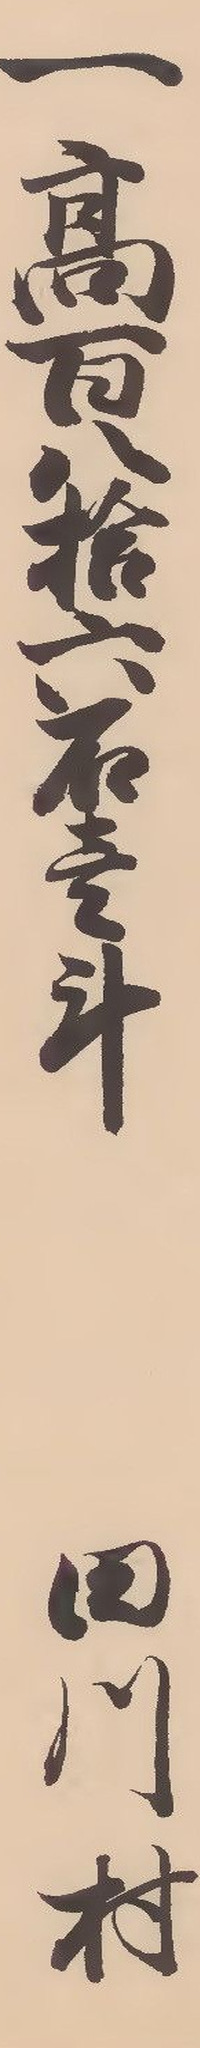一高百八拾六石壱斗田川村

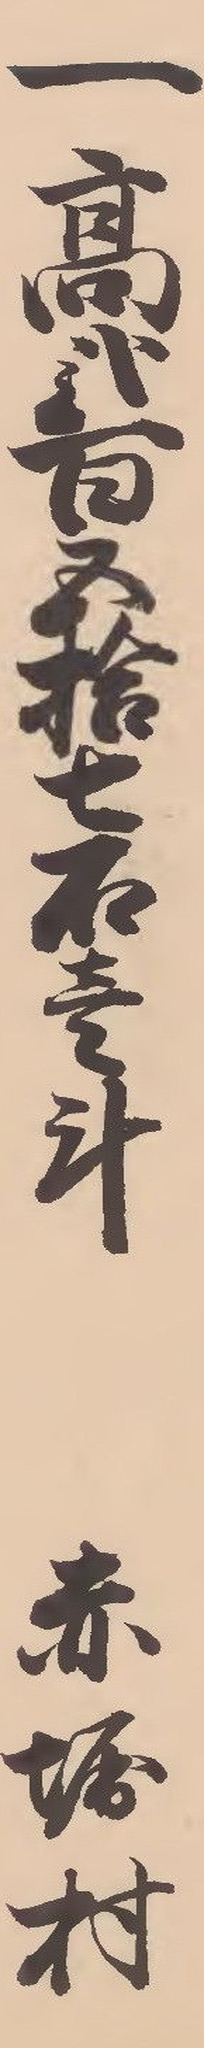一高弐百五拾七石壱斗赤堀村
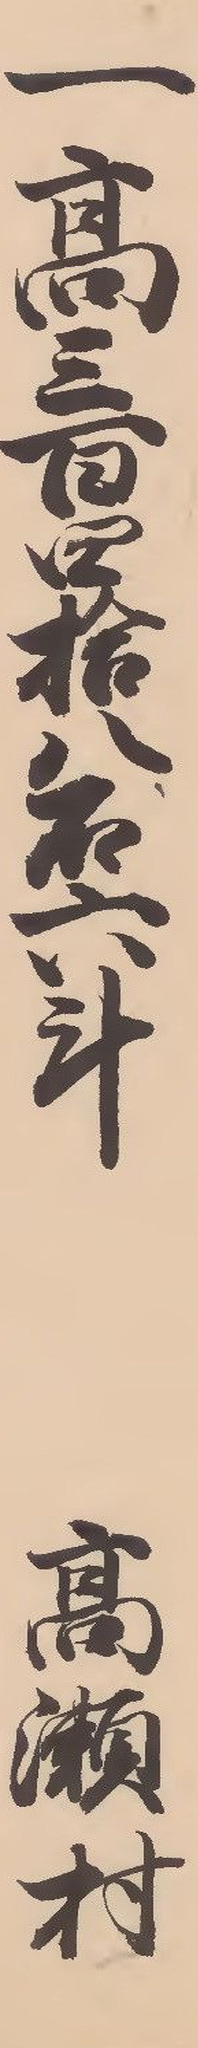一高三百四拾八石六斗高瀬村
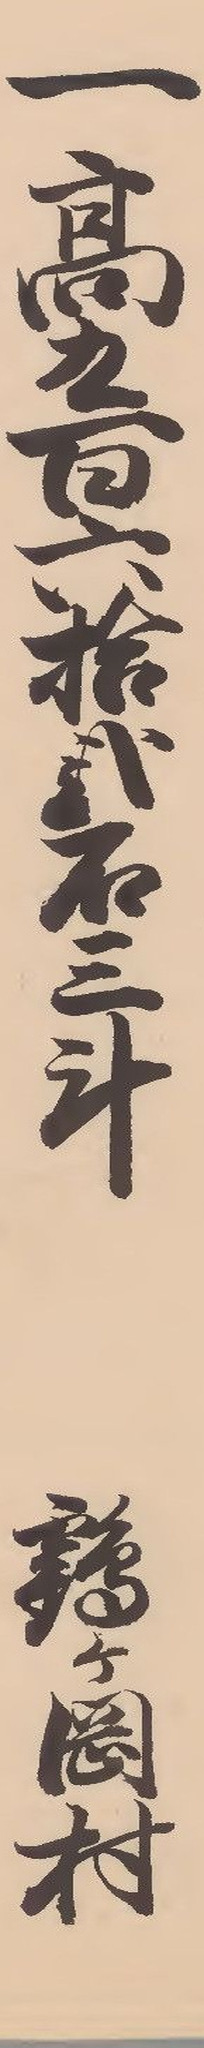一高九百六拾弐石三斗鶴ヶ岡村
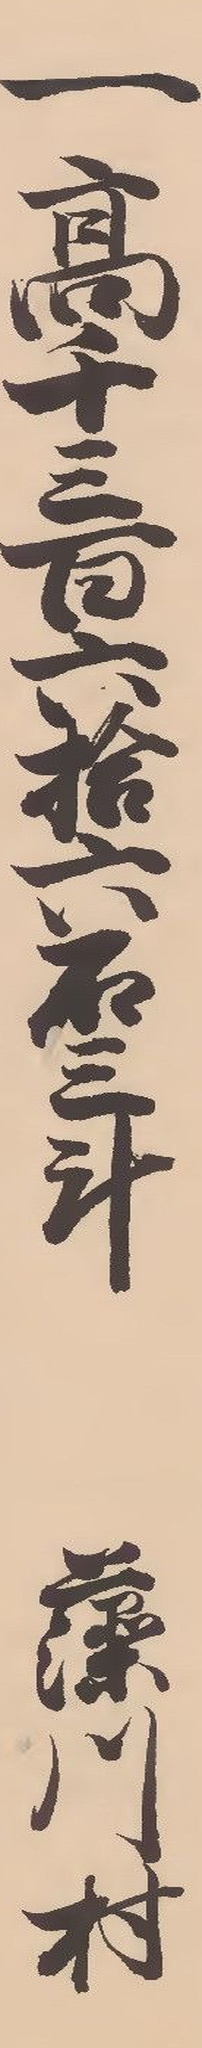一高千三百六拾六石三斗藻川村
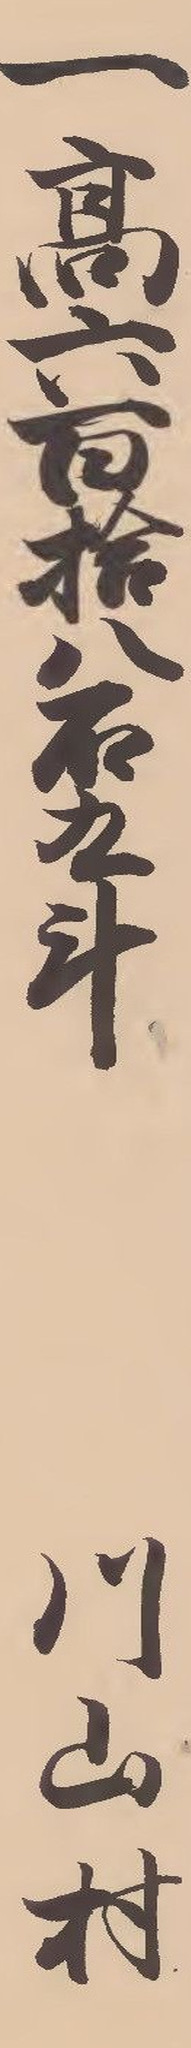一高六百拾八石九斗川山村
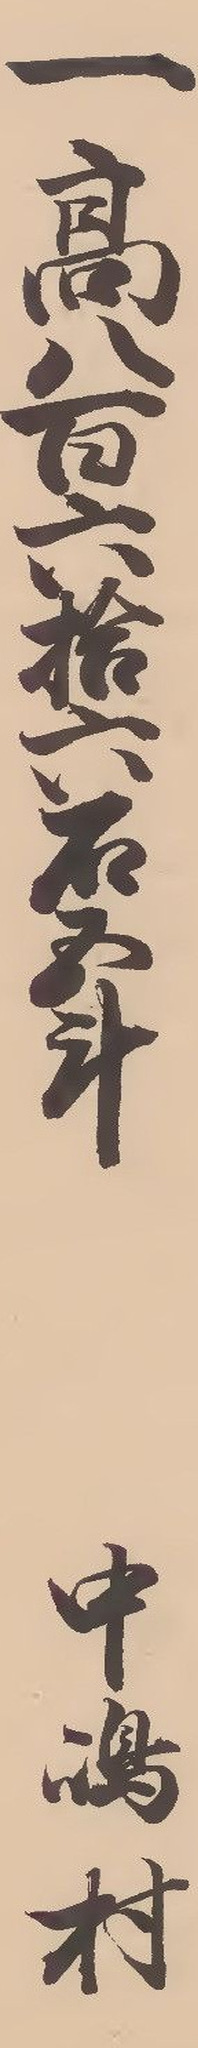一高八百六拾六石五斗中島村

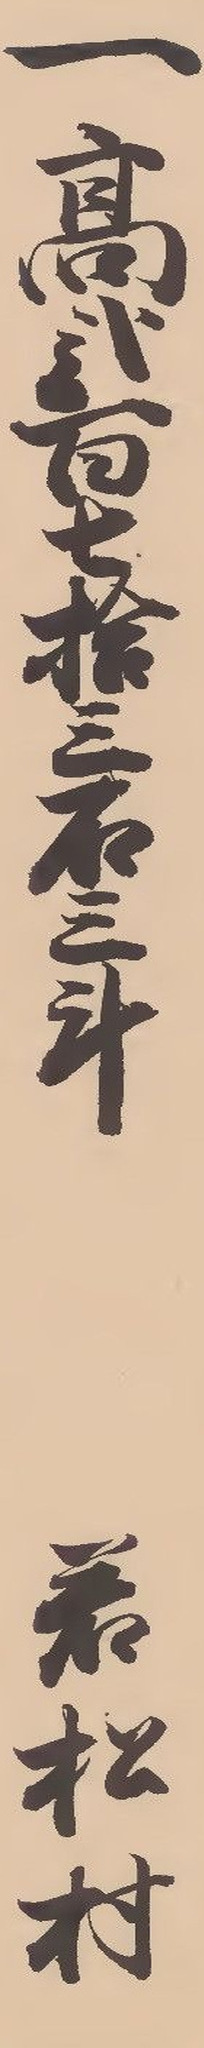一高弐百七拾三石三斗若松村
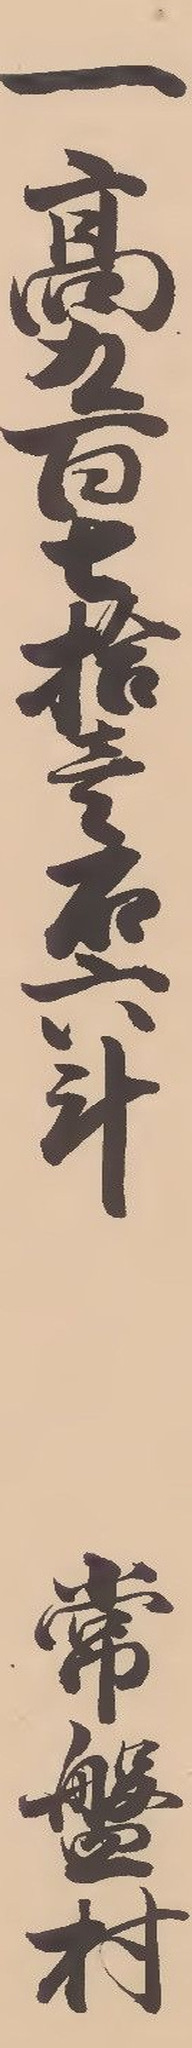一高九百七拾壱石六斗常盤村
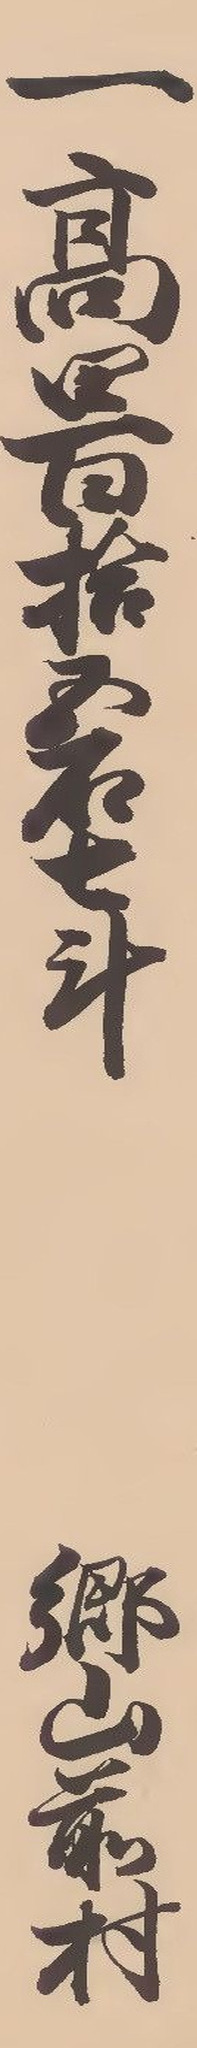一高四百拾五石七斗郷山前村
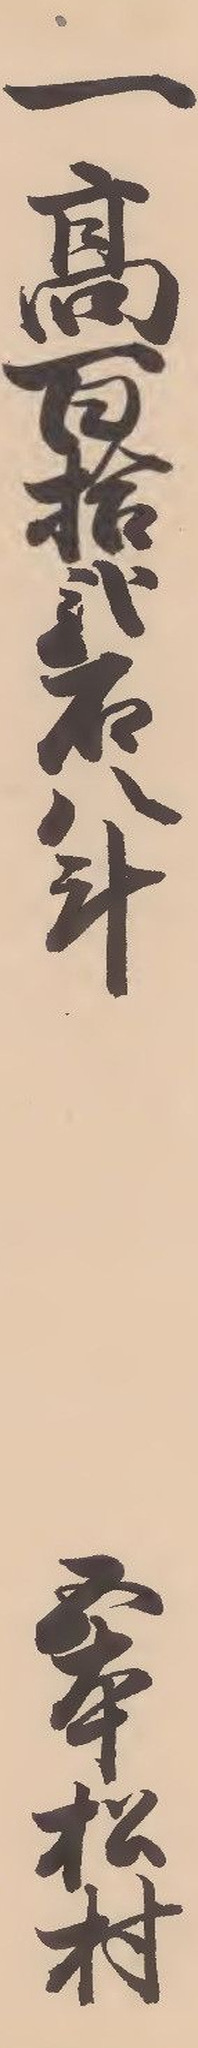一高百拾弐石八斗五本松村
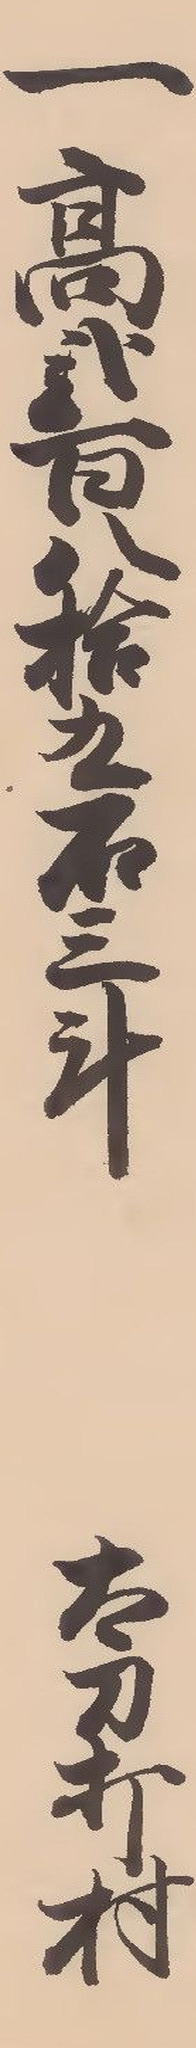一高弐百八拾九石三斗太刀打村

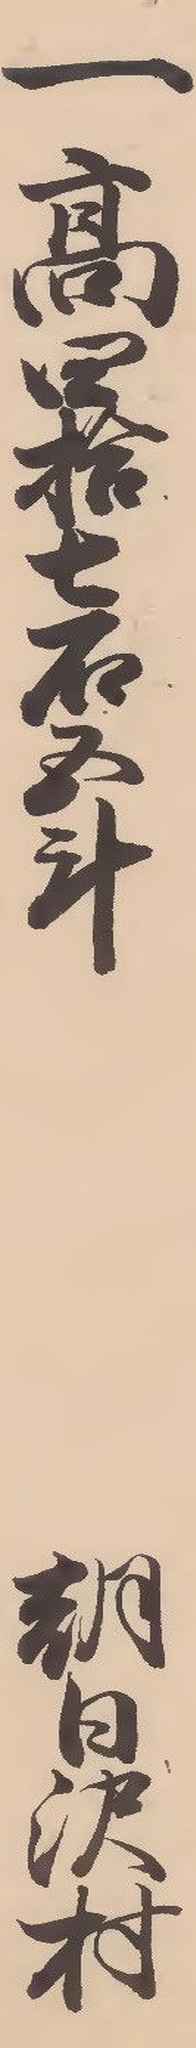一高四拾七石五斗朝日沢村
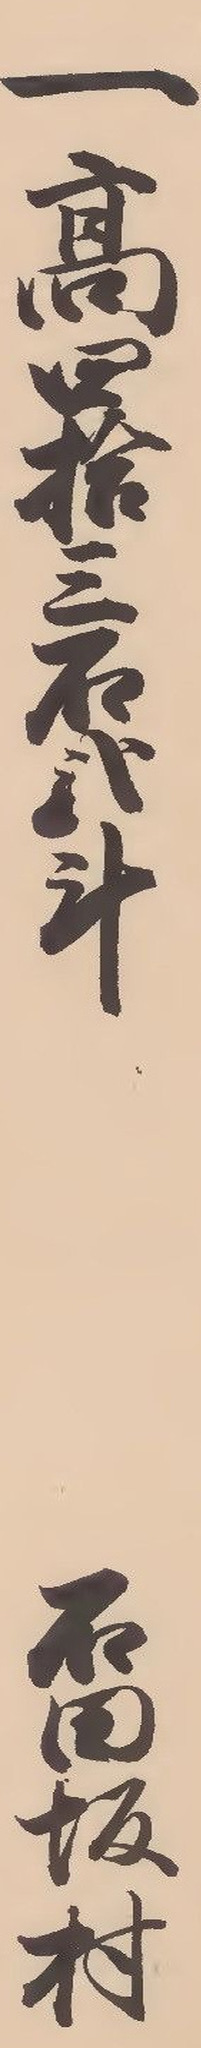一高四拾三石弐斗石田坂村
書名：陸奥国郷帳　７
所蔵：国立公文書館 National Archives of Japan
